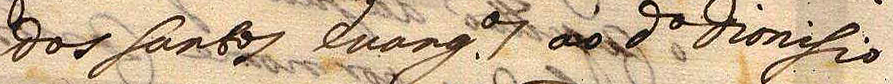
dos Santos Euang.os ao d.o Dionisio
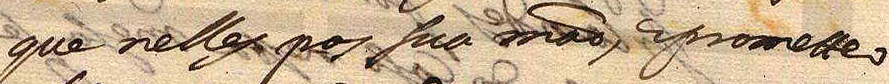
que nelles pos sua mão, E prometteo
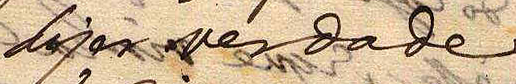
dizer uerdade
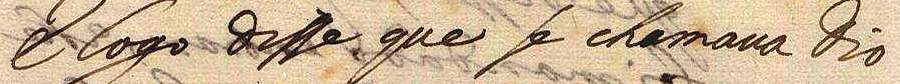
E logo disse que se chamava Dio
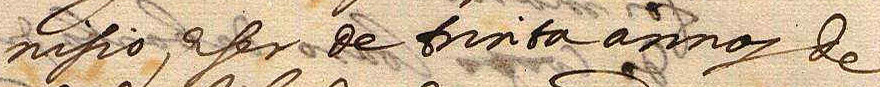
nisio, E ser de trinta annos de
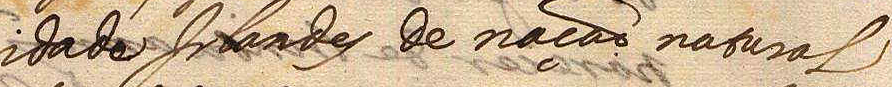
idade Jrlandes de nação naturaL
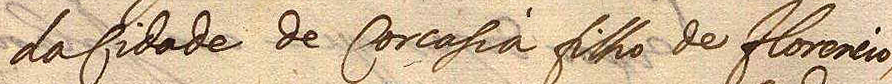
da Cidade de Corcasia filho de florencio,
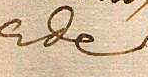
E de
